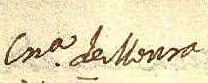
Cn.a de Moura
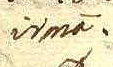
irmã.
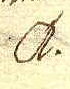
R.
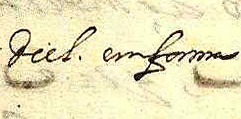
decl. em forma
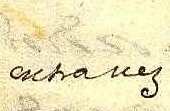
outra uez
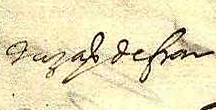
razaõ de fiar
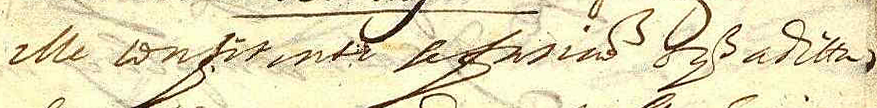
elle confitente se faziaõ o q̄ a ditta
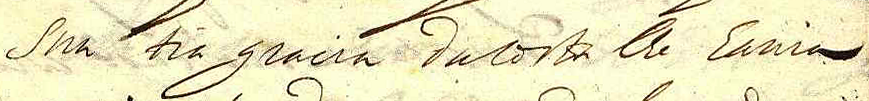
sua tia gracia da costa lhe hauia
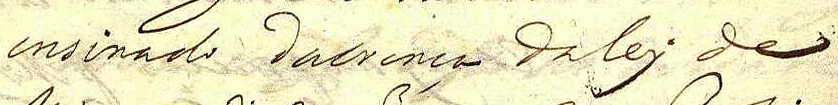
ensinado da crença da ley de
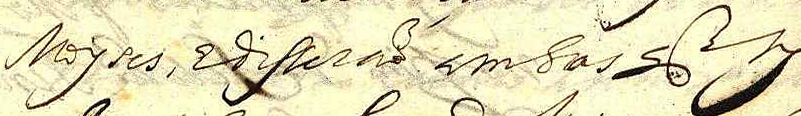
Moyses, E disseraõ ambas q̄ sy
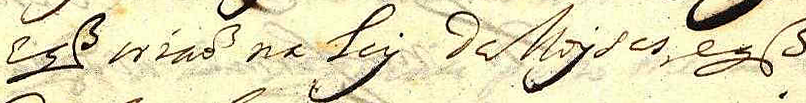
E q̄ criaõ na Ley de Moyses, e q̄
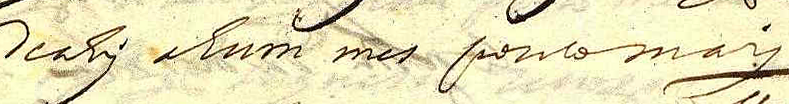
de ahy a hum mes pouco mais
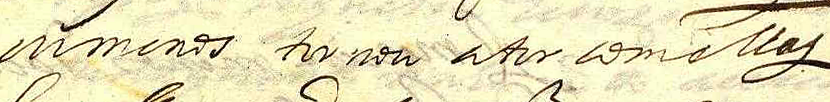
ou menos tornou a ter com ellas
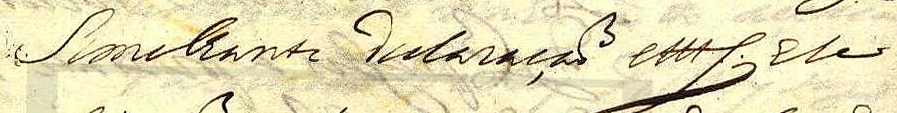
semelhante declaraçaõ etttꝭ. E se
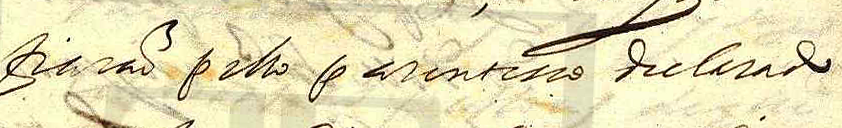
fiaraõ pello parentesco declarado
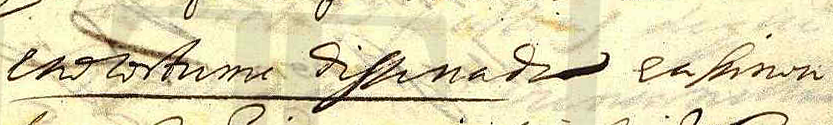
e no costume disse nada e assinou
